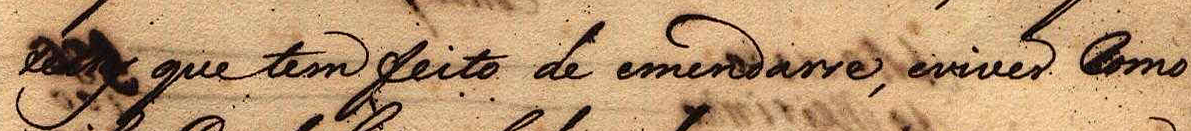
te_s que tem feito de emendarse, e viver Como
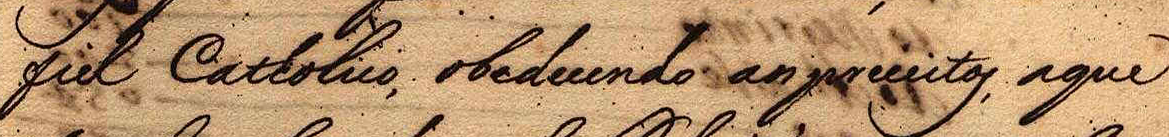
fiel Catholico, obedecendo aos preceitos, a que
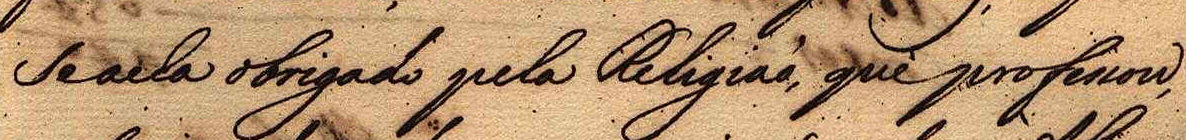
se acha obrigado pela Religiaõ, que professou,
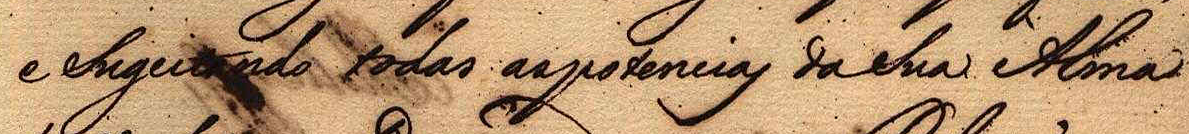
e Sugeitando todas as potencias da Sua Alma
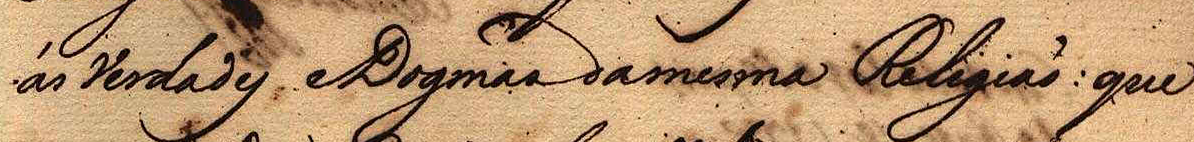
ás verdades, e Dogmas da mesma Religiaõ: que
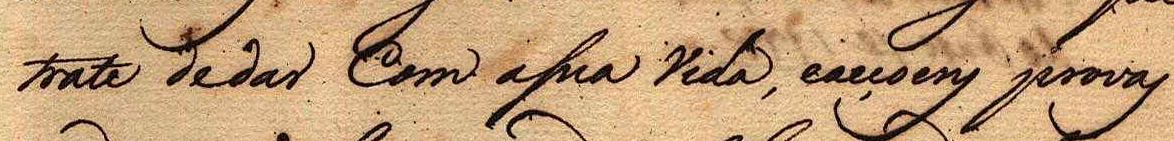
trate de dar Com a sua Vida, e acçoens provas
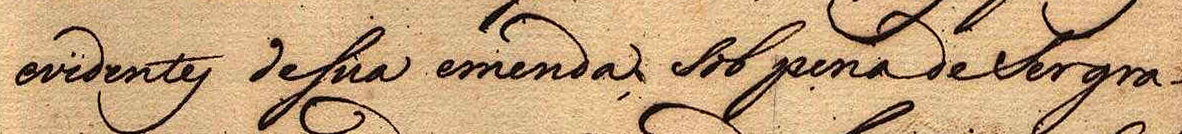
evidentes de sua emenda, sob pena de Ser gra
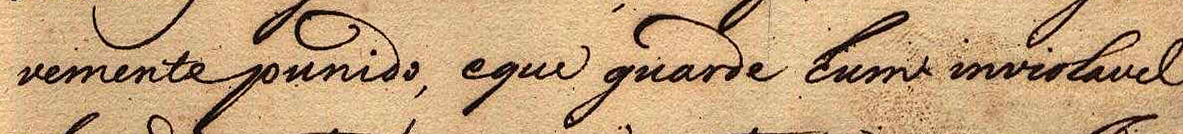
vemente punido, e que guarde hum inviolavel
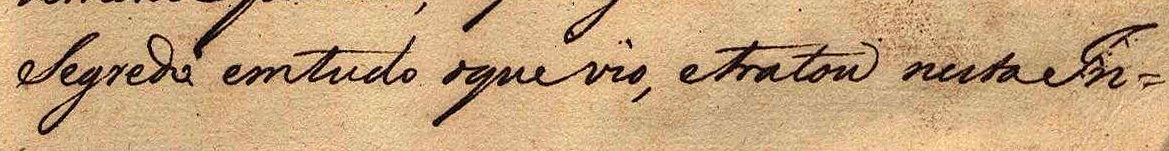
Segredo em tudo o que vio, e tratou nesta In
